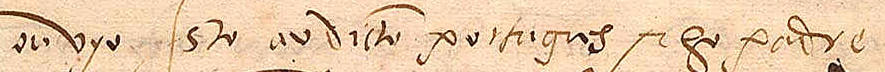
ouvyo Jsto ao dīcto portugues e ho padre
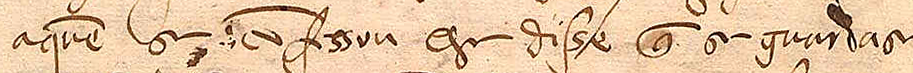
a q̄ue se cōfessou lhe disse q̄ se guardase
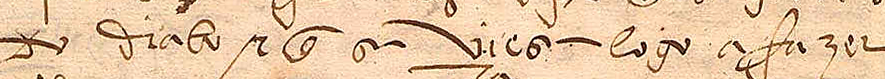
do diabo e q̄ se viese logo a fazer
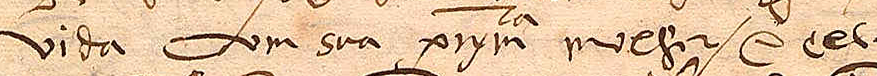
vida com sua prymra molher / e elle
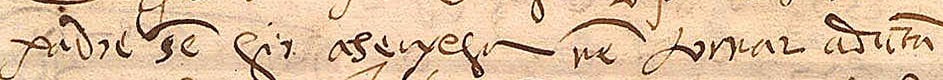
padre sē hir a seuylha nē tornar a dic̄ta
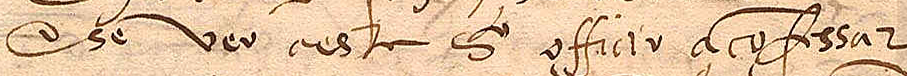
e se veo a este Sto officio a cōfessar
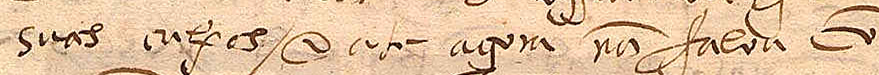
suas culpas / e ate agora nā falou cō
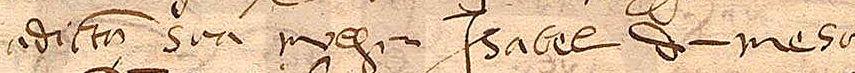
a dic̄ta sua molher Jsabel de mesa
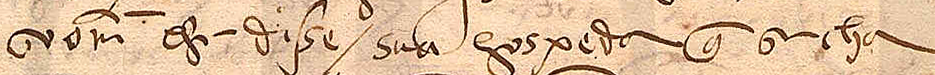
soomte lhe disse / sua hospeda q̄ se cha
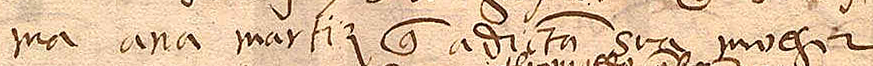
ma ana martiz q̄ a dic̄ta sua molher
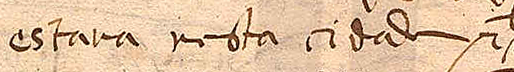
estaua nesta cidade e
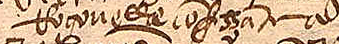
Rogou elle cōfessāte a
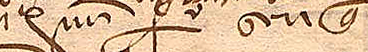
hūu fo seu q̄
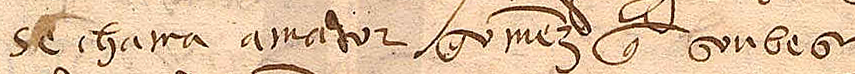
se chama amador / gom̄ez q̄ soubese
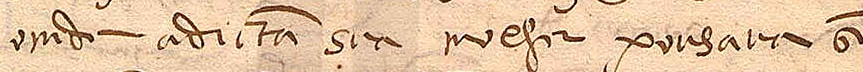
omde a dic̄ta sua molher pousaua sē
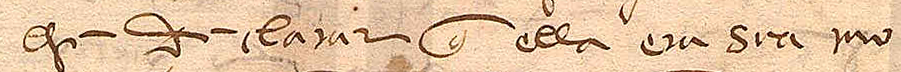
lhe declarar q̄ ella era sua mo
